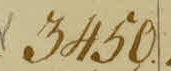3450.
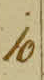10
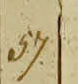57.
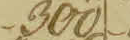300
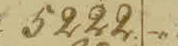5222.
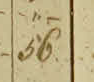56.
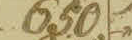650
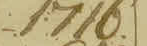1716.
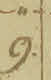9.
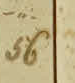56
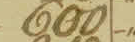600.
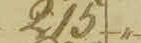215
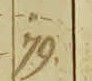79.
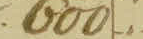600
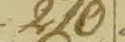210
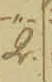2.
